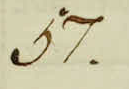57.
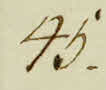45
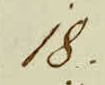18
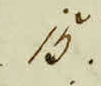15
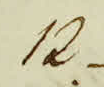12
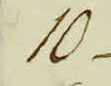10
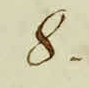8
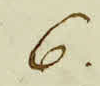6
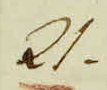21
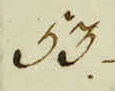53
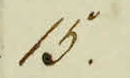15.
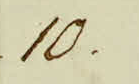10.
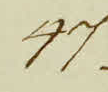47
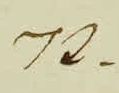72
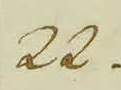22
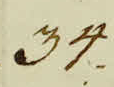34
